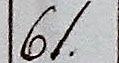61.
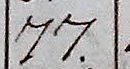77.
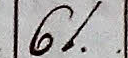61.
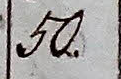50.
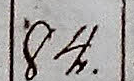84.
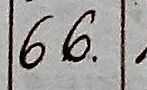66.
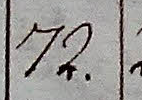72.
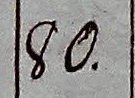80.
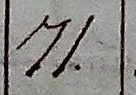71.
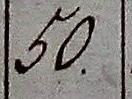50.
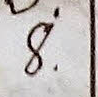8.
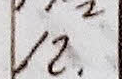12.
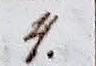4.
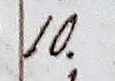10.
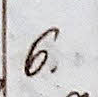6.
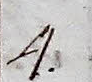4.
